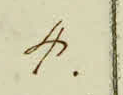4.
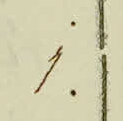1.
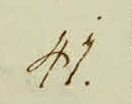41.
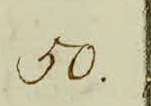50.
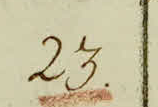23.
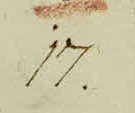17.
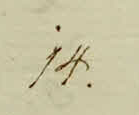14.
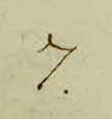7.
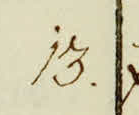13.
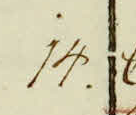14.
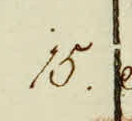15.
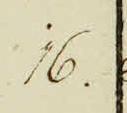16.
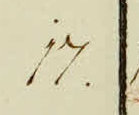17.
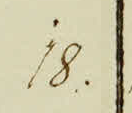18.
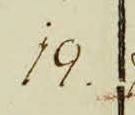19.
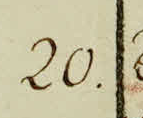20.
